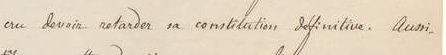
cru devoir retarder sa constitution définitive. Aussi-
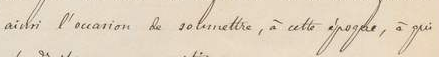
ainsi l'occasion de soumettre, à cette époque, à qui
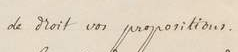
de droit vos propositions.
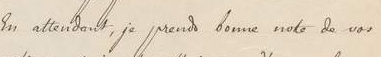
En attendant, je prends bonne note de vos
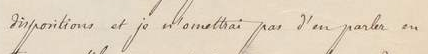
dispositions et je n'omettrai pas d'en parler en
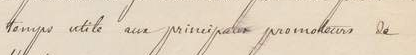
temps utile aux principaux promoteurs de
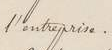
l'entreprise.
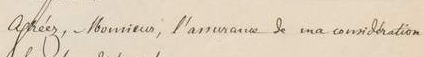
Agréez, Monsieur, l'assurance de ma considération
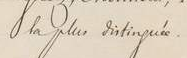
la plus distinguée.
